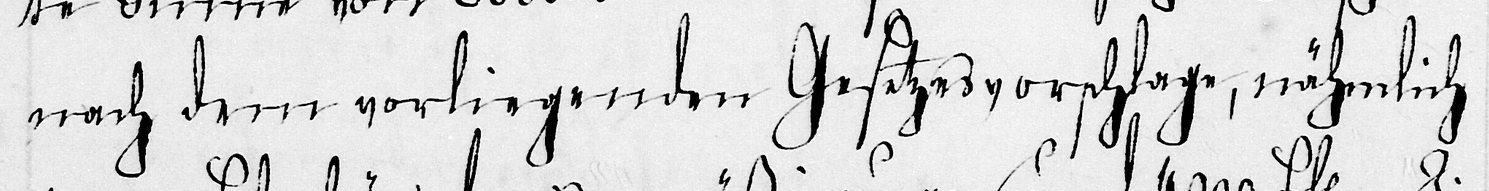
nach dem vorliegenden Gesetzesvorschlage, nähmlich
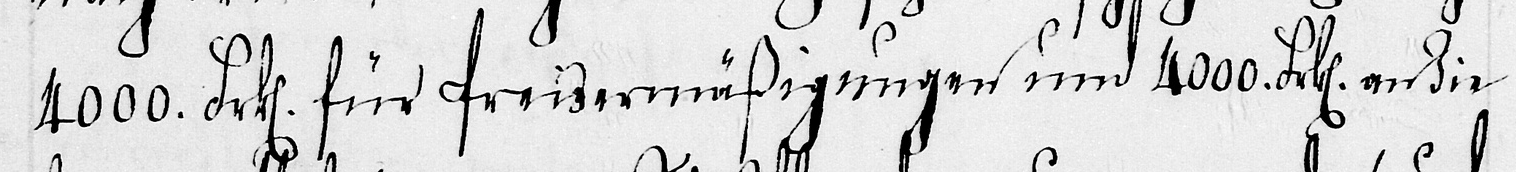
4000. Frk[en]. für Preisermäßigungen und 4000. Frk[en]. an die
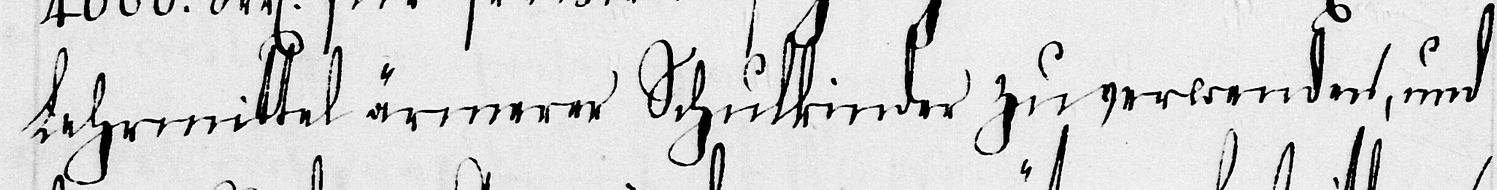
Lehrmittel ärmerer Schulkinder zu verwenden, und
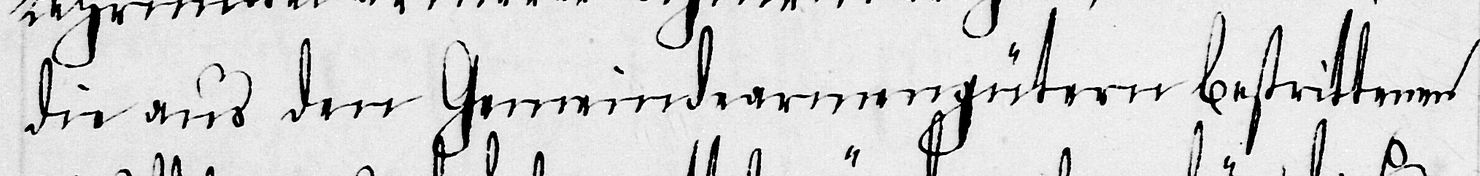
die aus den Gemeindarmengütern bestrittenen
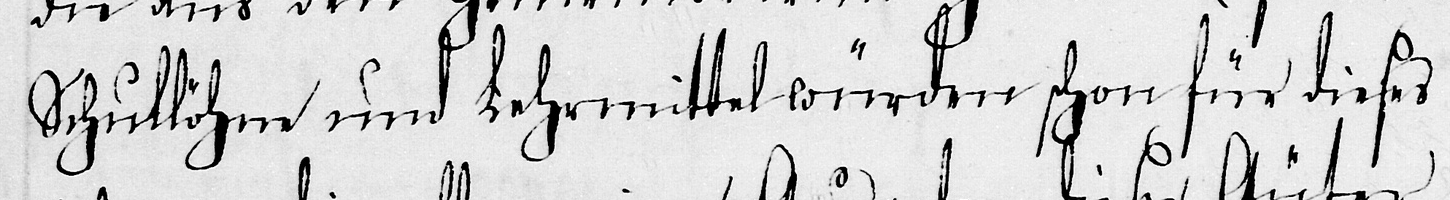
Schullöhne und Lehrmittel würden schon für dieses
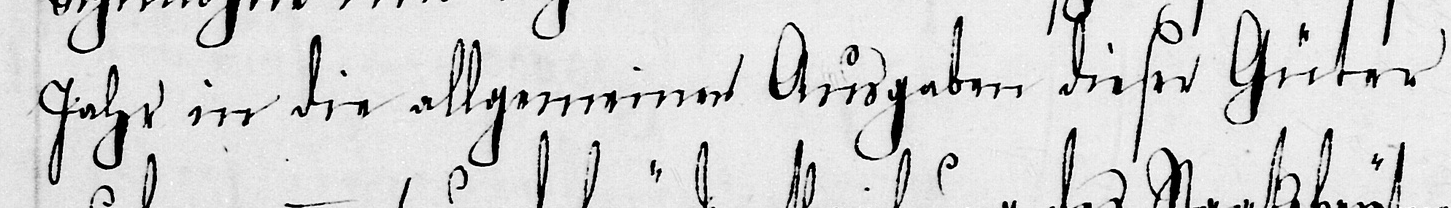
Jahr in die allgemeinen Ausgaben dieser Güter
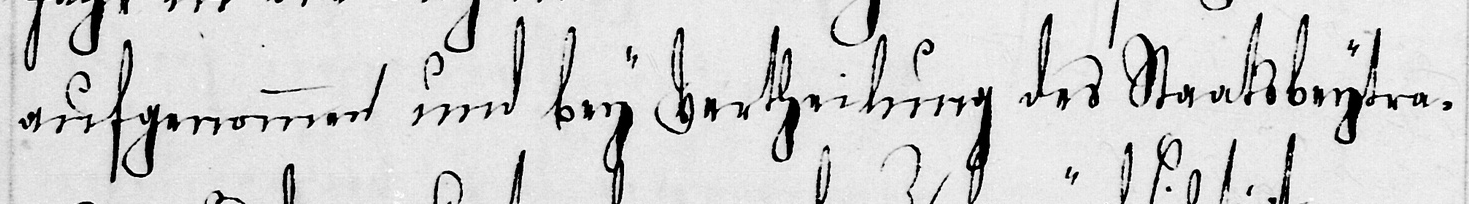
aufgenommen und bey Vertheilung des Staatsbeytra¬
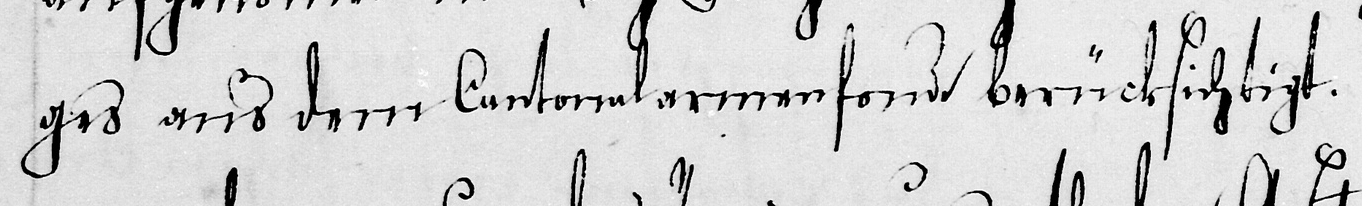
ges aus dem Cantonalarmenfonde berücksichtigt.
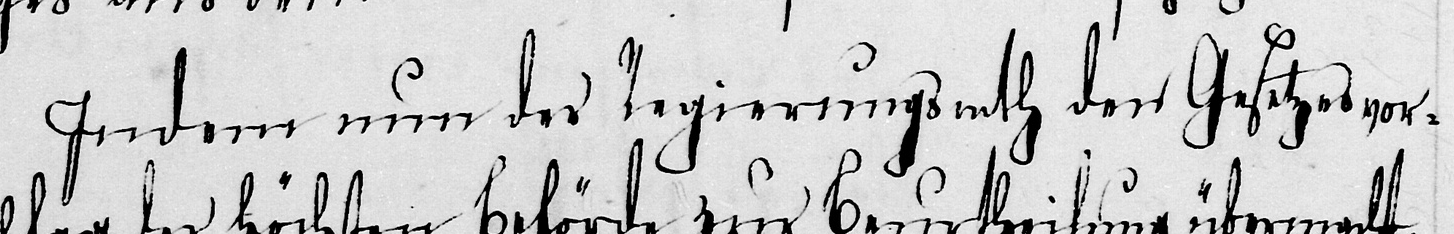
Indem nun der Regierungsrath den Gesetzesvor¬
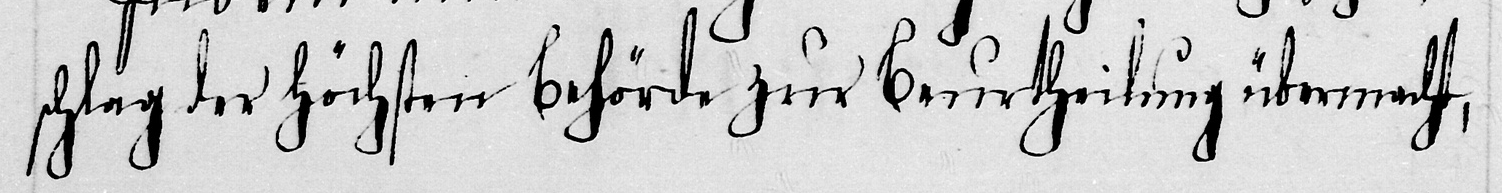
schlag der Höchsten Behörde zur Beurtheilung übermacht,
